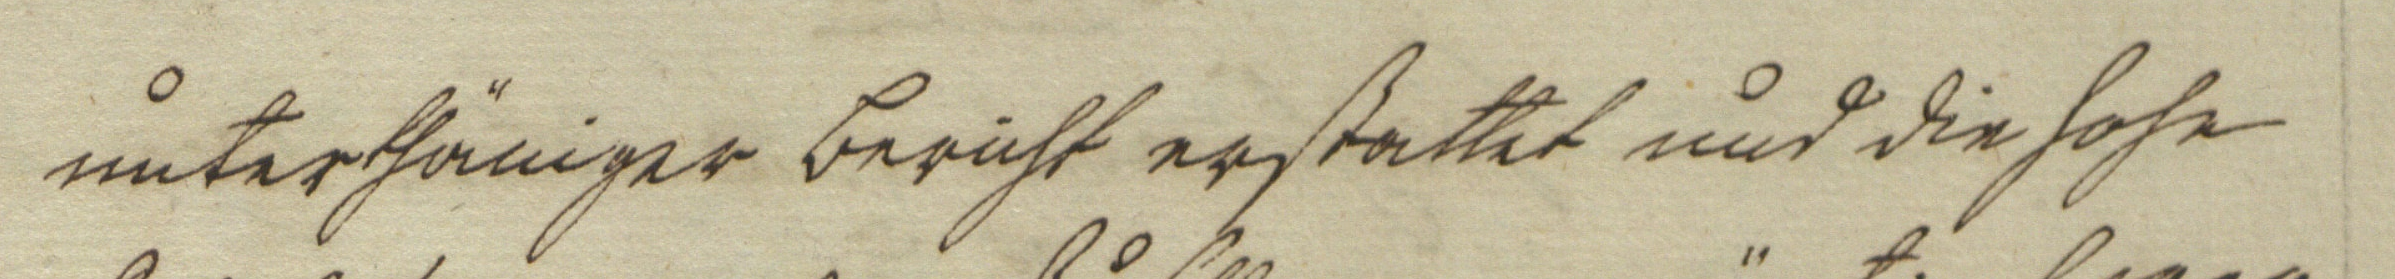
unterthäniger Bericht erstattet und die hohe
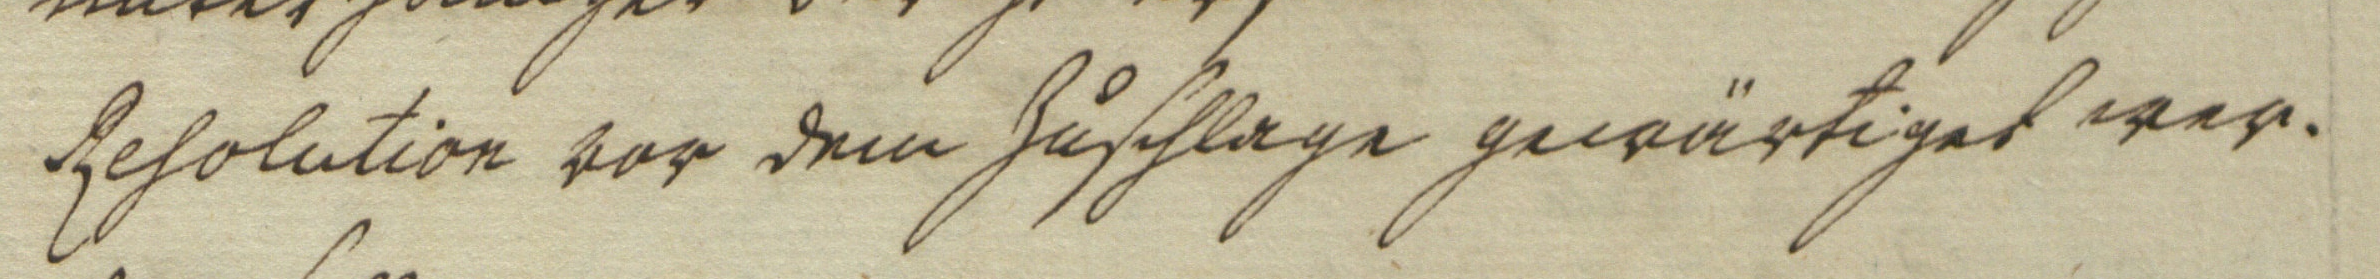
Resolution vor dem Zuschlage gewärtiget wer¬
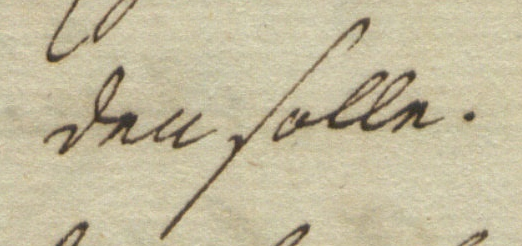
den solle.
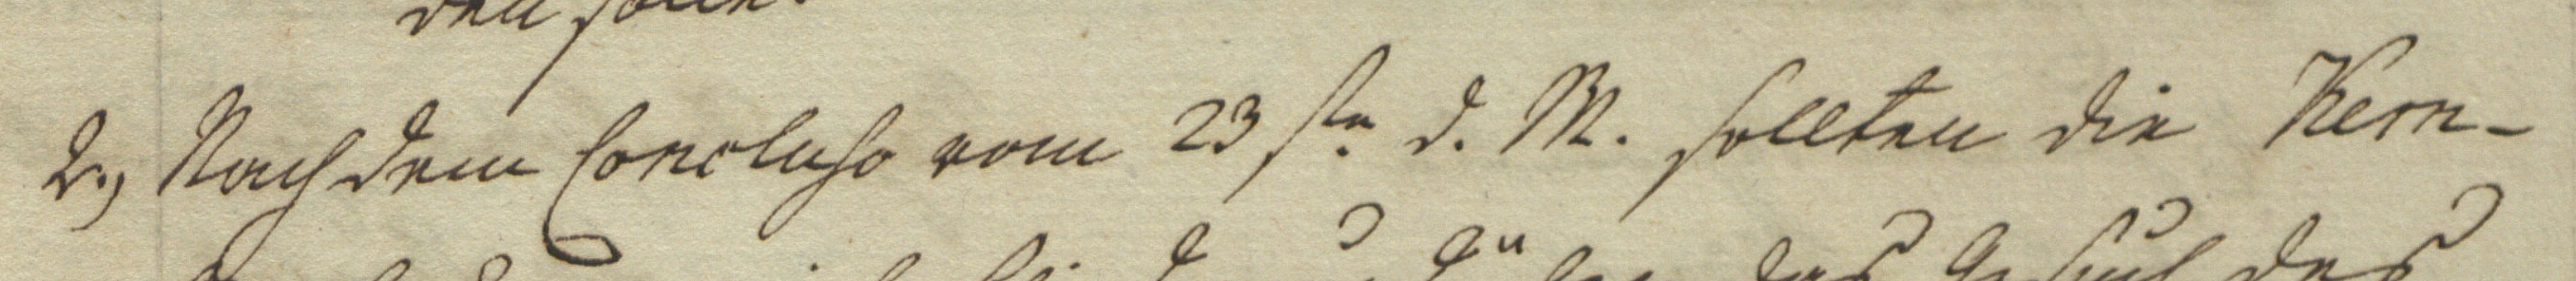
2., Nach dem Concluso vom 23 sten d. M. sollten die Kem¬
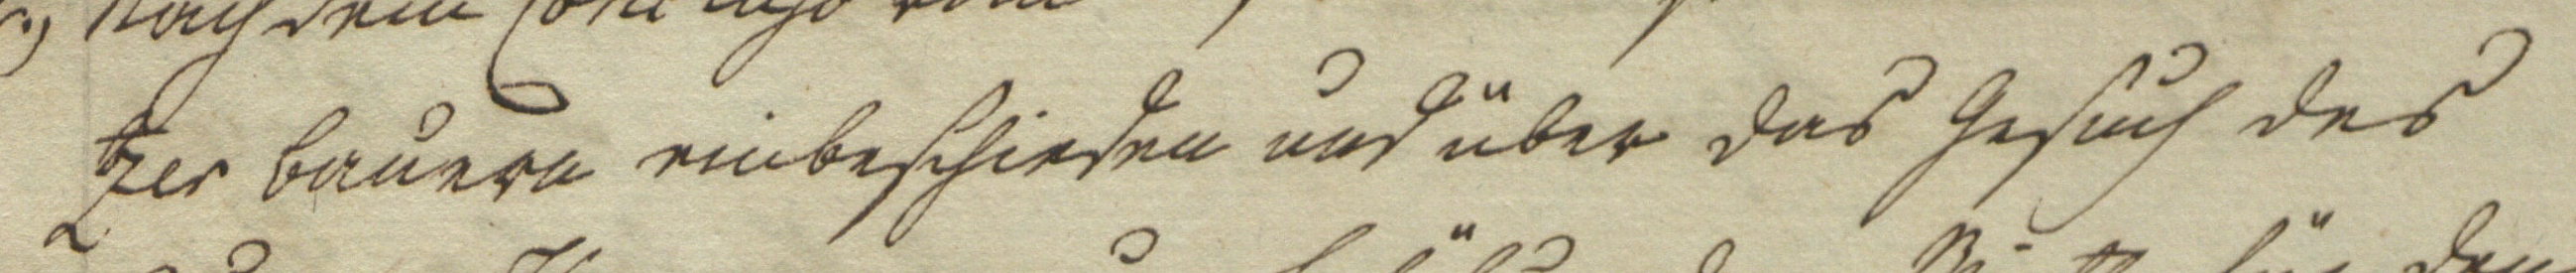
tzer Bauern einbeschieden und über das Gesuch des
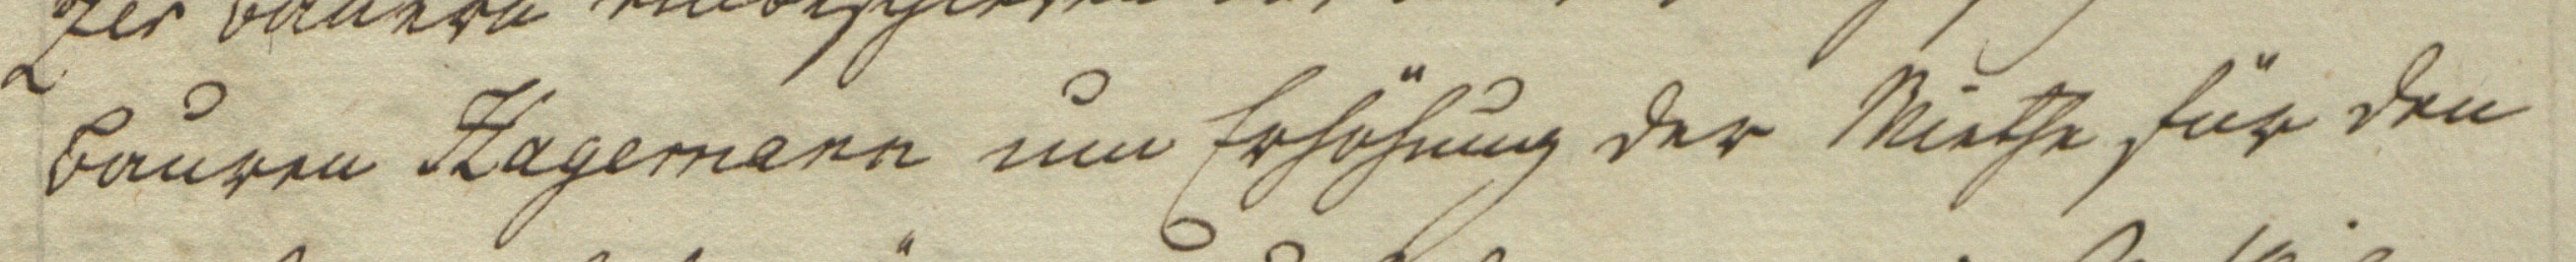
Bauren Hagemann um Erhöhung der Miethe für den
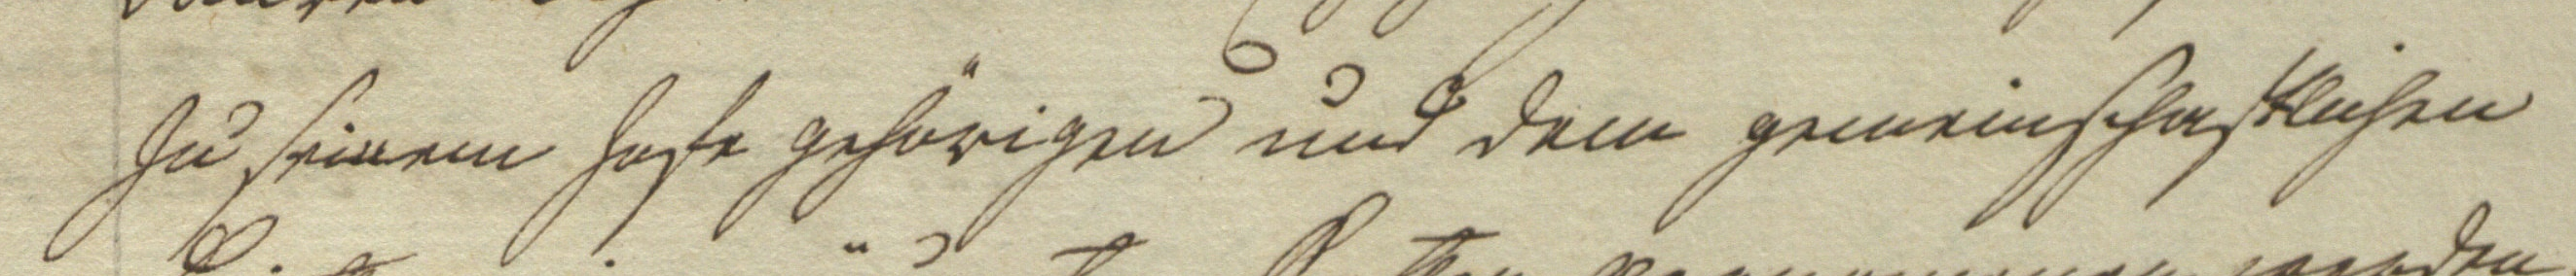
zu seinem Hofe gehörigen und dem gemeinschaftlichen
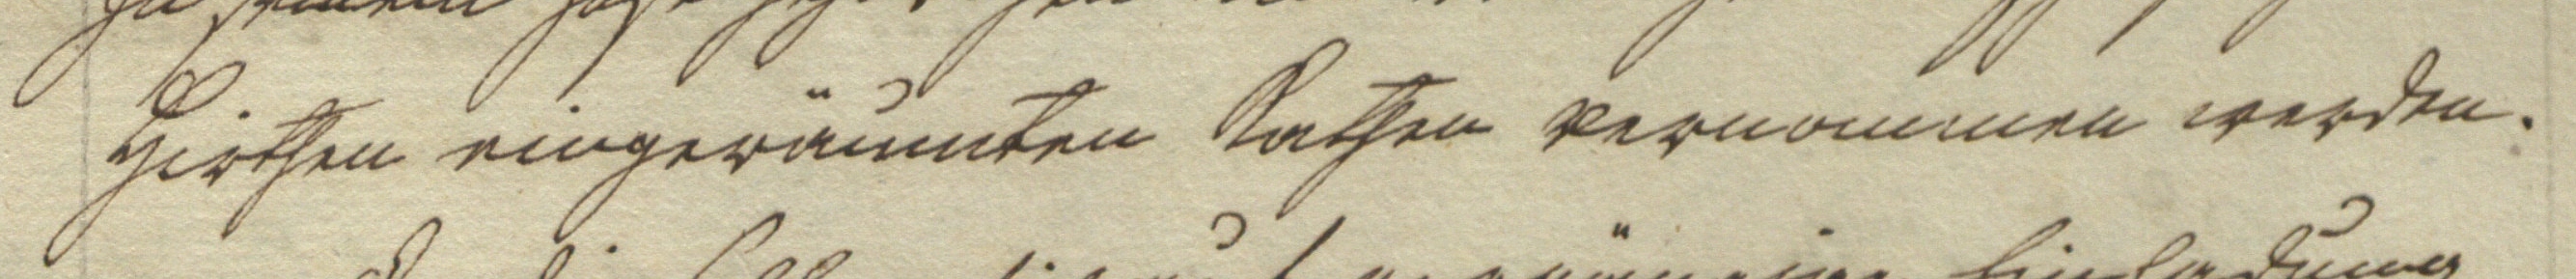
Hirthen eingeräumten Kathen vernommen werden.
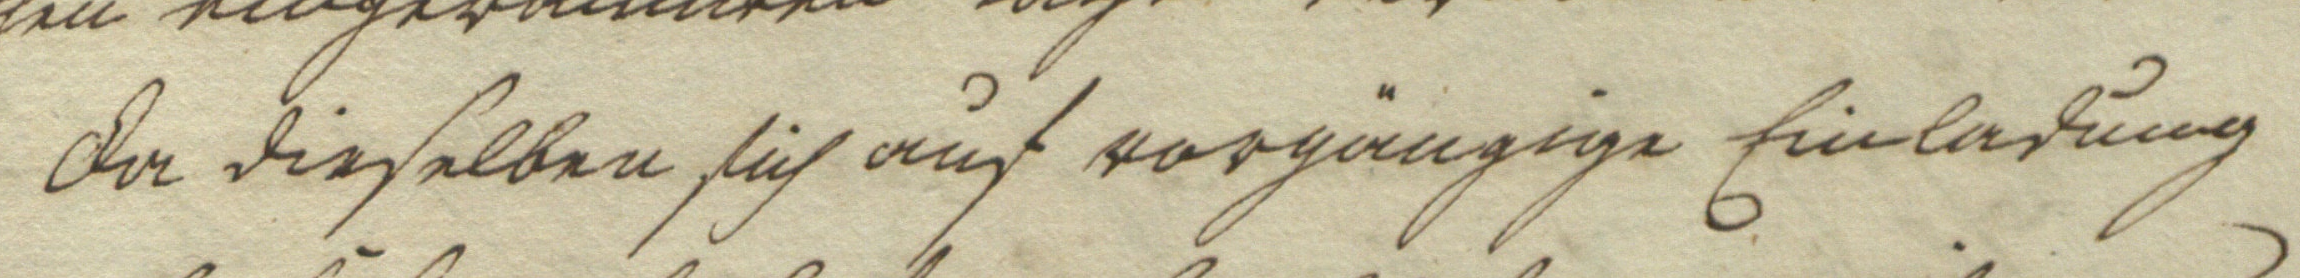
Da dieselben sich auf vorgängige Einladung
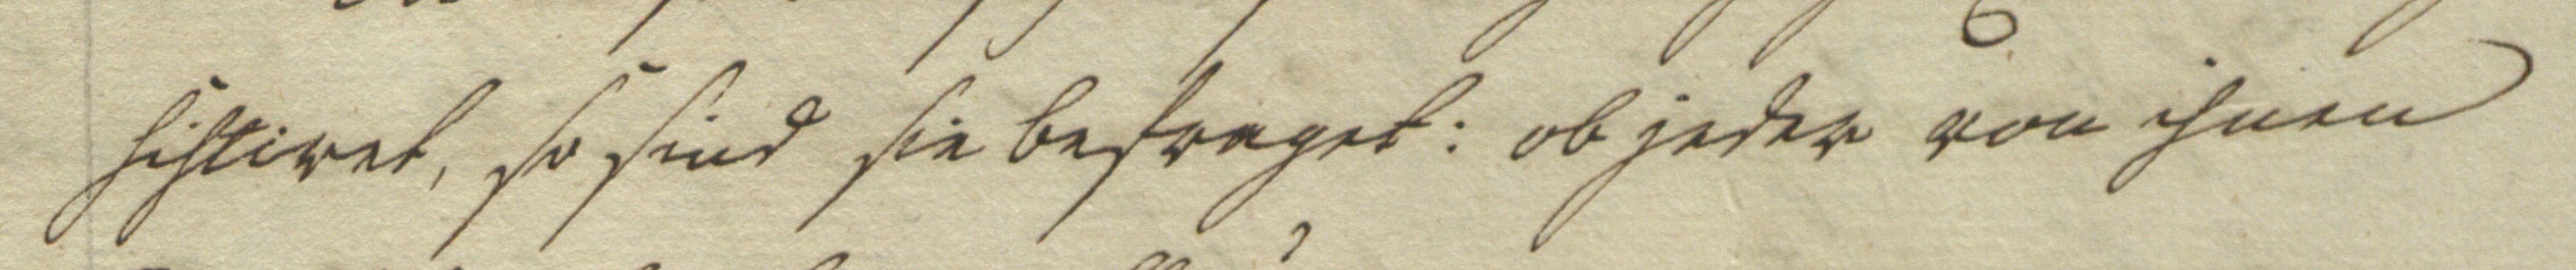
sistiret, so sind sie befraget: ob jeder von ihnen
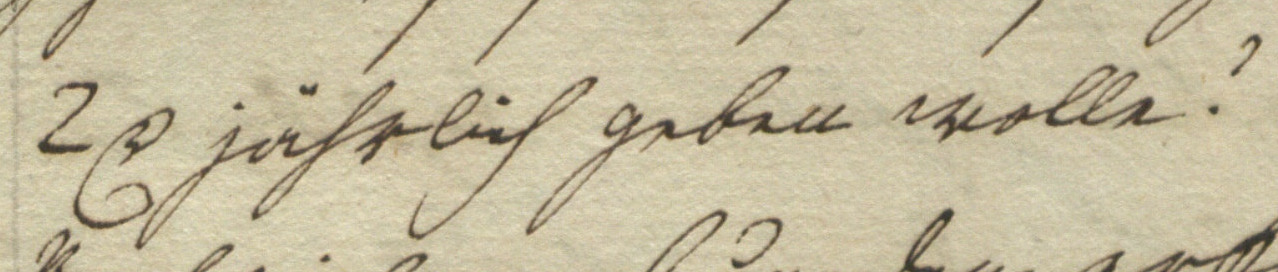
2 l. jährlich geben wolle?
